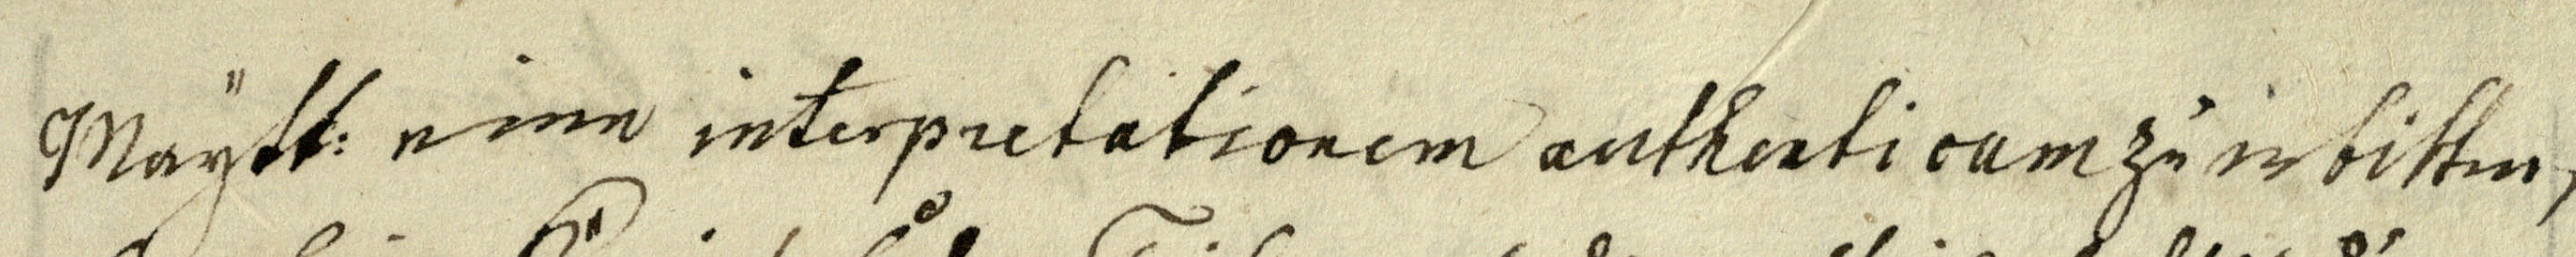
Maÿtt. eine interpretationem authenticum zu erbitten,
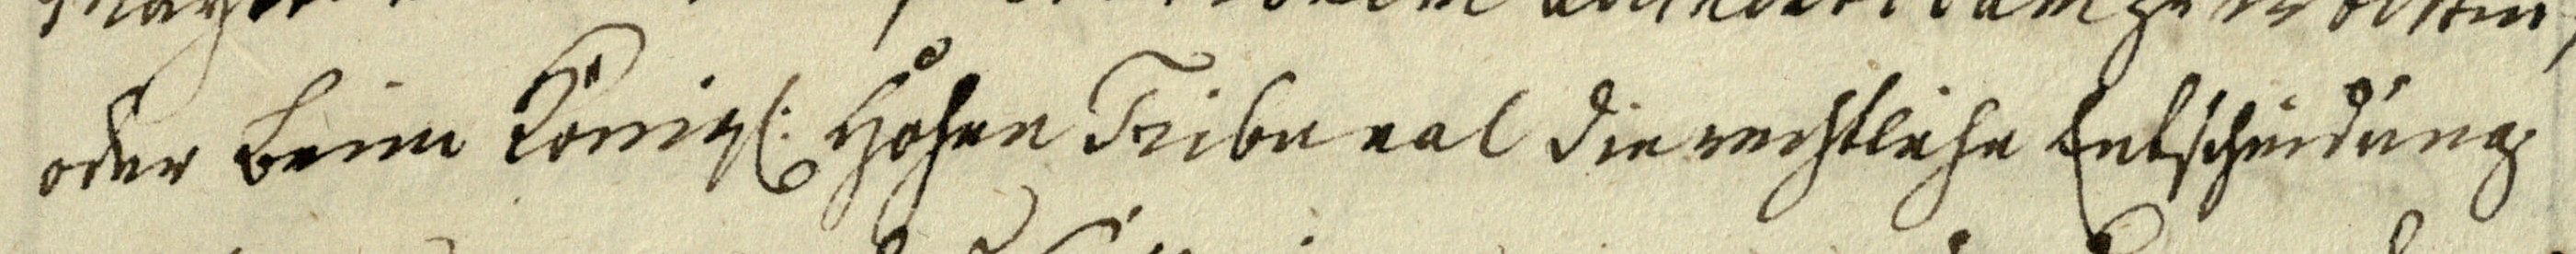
oder beim Königl. Hohen Tribunal die rechtliche Entscheidung
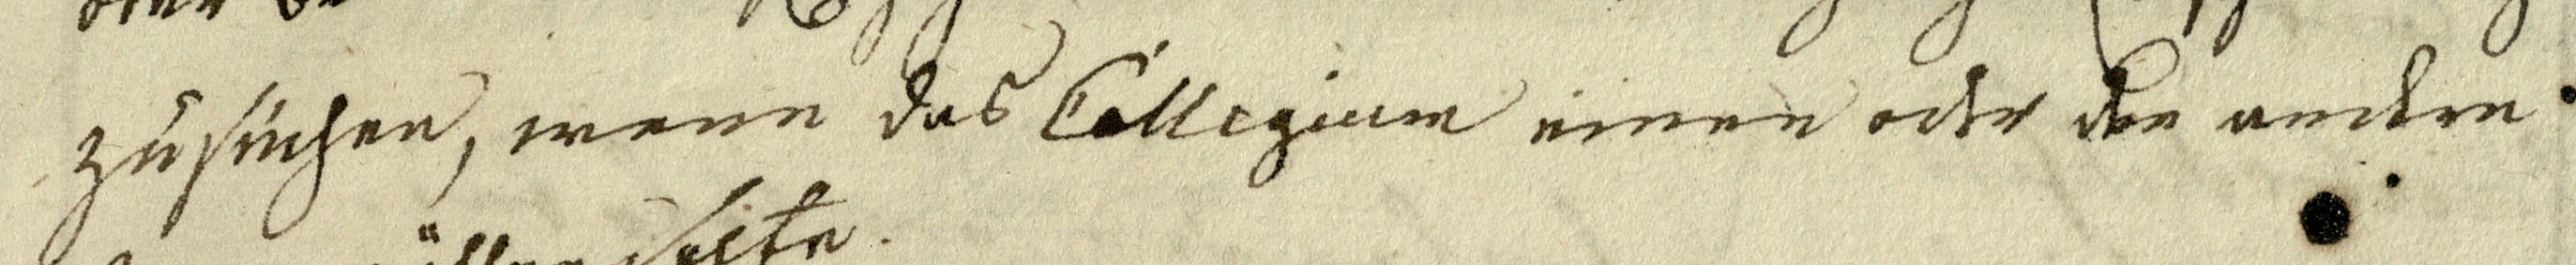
zu suchen, wenn das Collegium einen der den andern
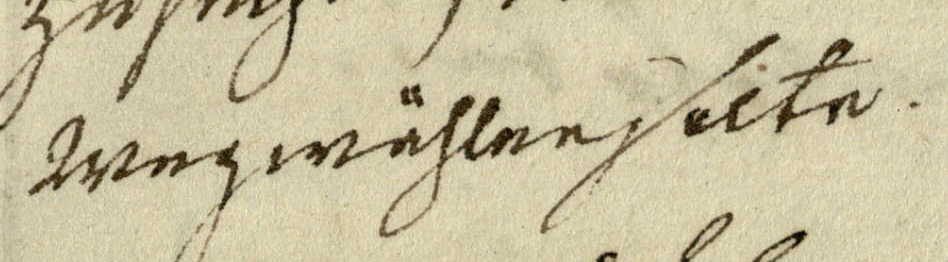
Weg wählen solte.
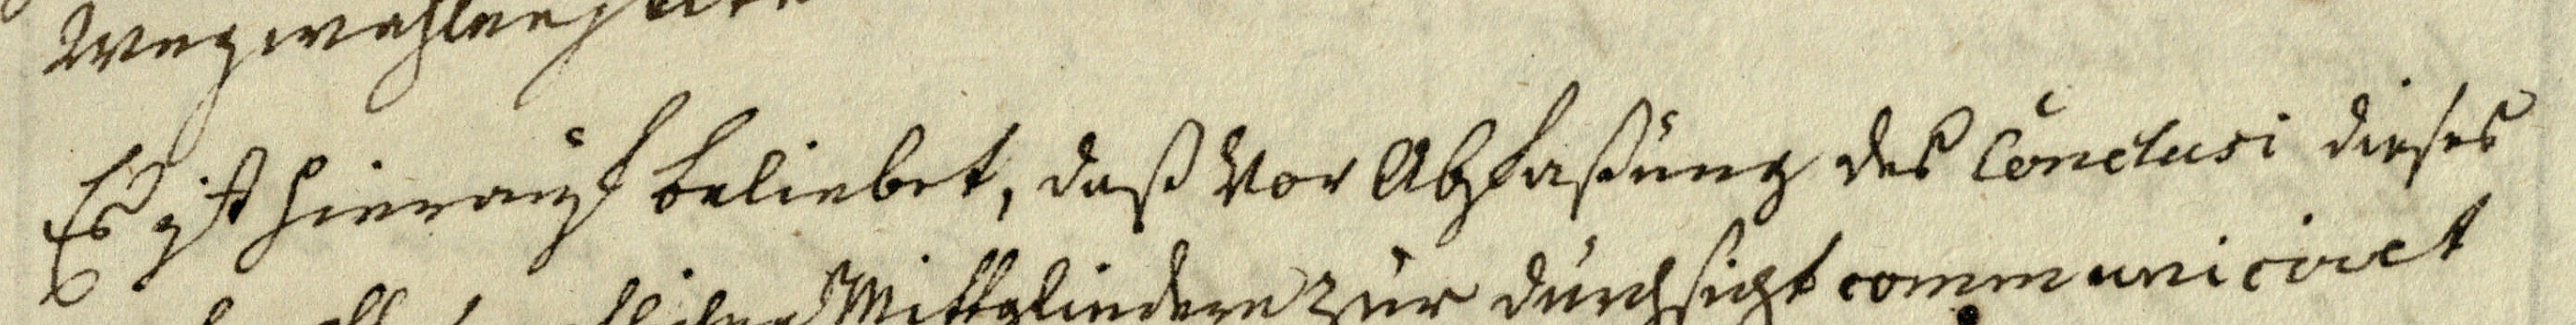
Es ist hierauf beliebet, daß vor Abfassung des Conclusi dieses
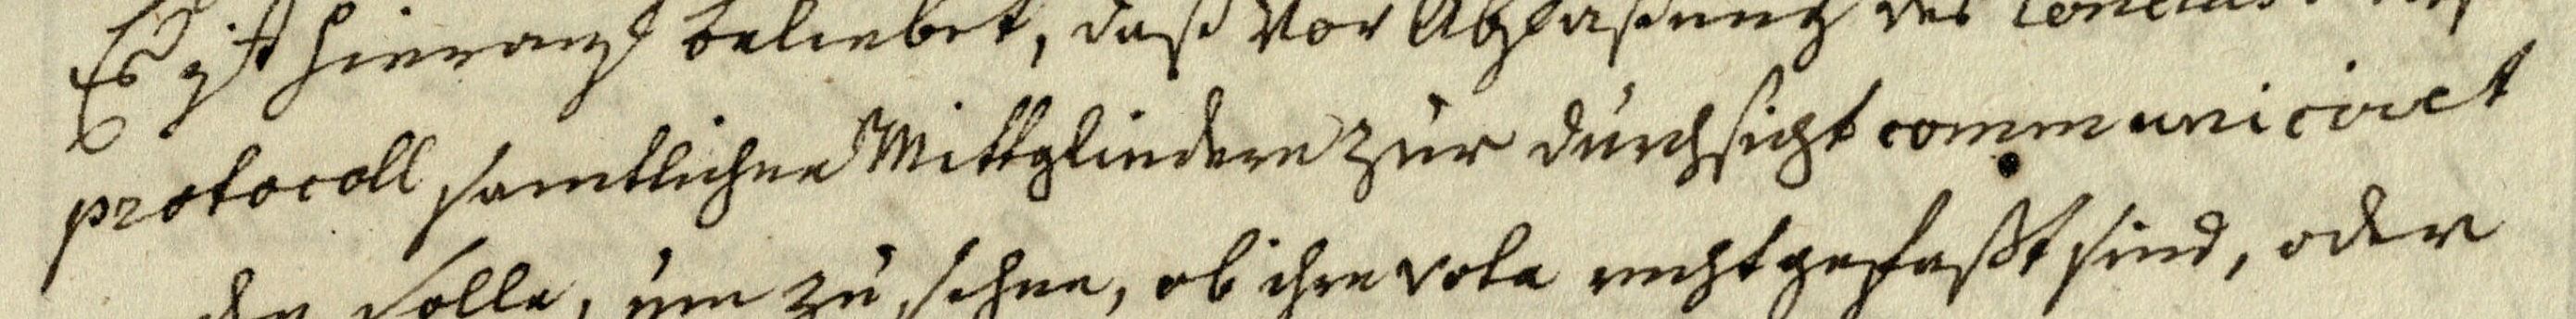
protocoll samtlichen Mittgliederm zur Durchsicht communiciret
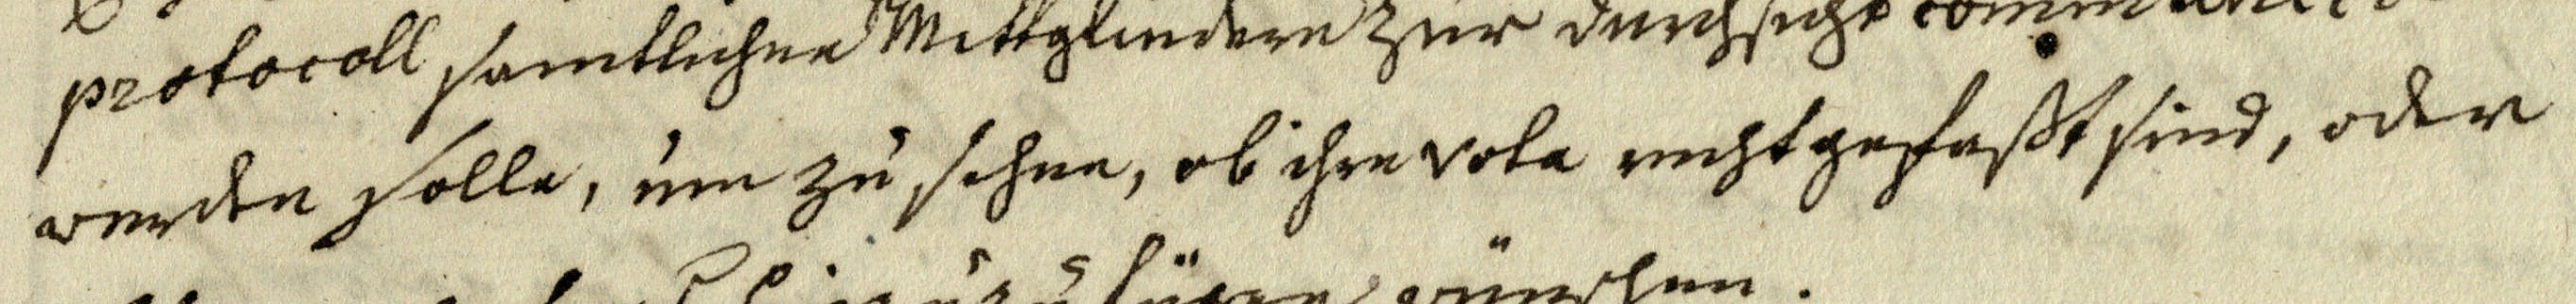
werden solle, um zu sehen, ob ihre vota recht gefaßt sind, oder
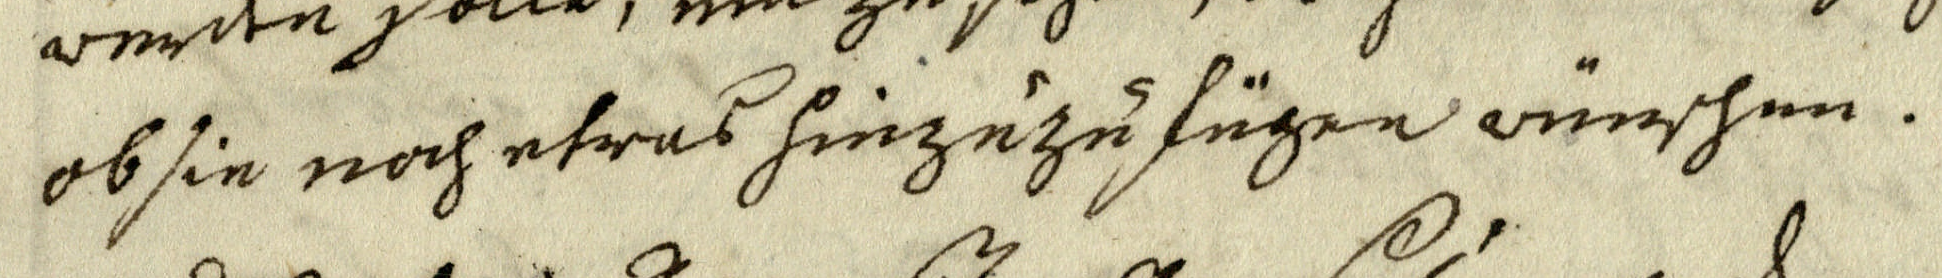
ob sie noch etwas hinzuzufügen wünschen.
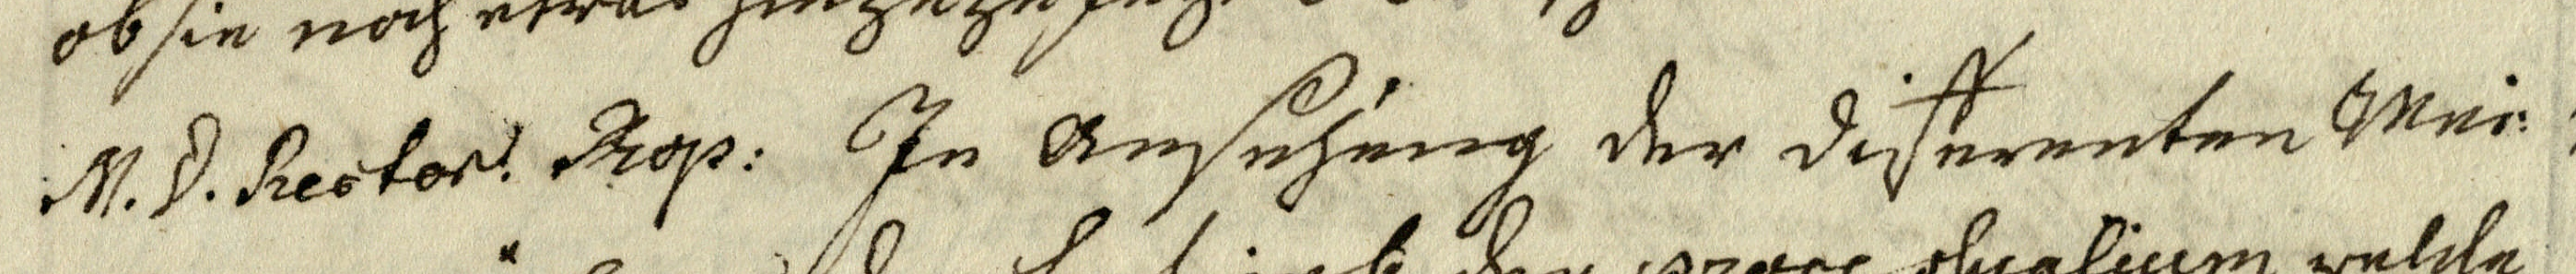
7. M. D. Rector: Prop: In Ansehung der differenten Mei¬
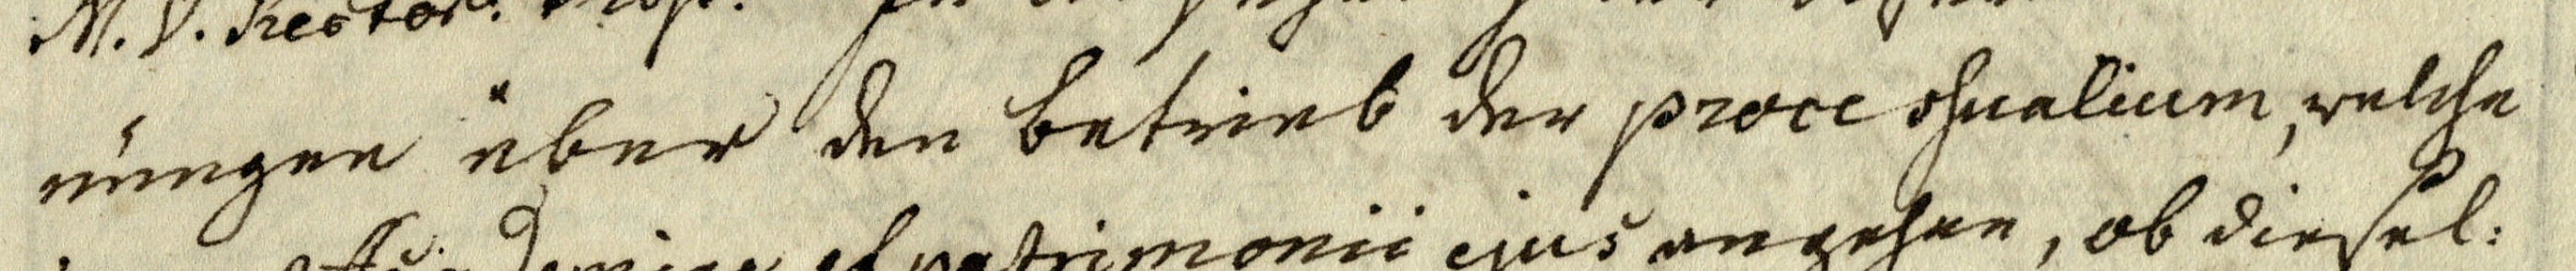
nungen über den Betrieb der processualium, welche
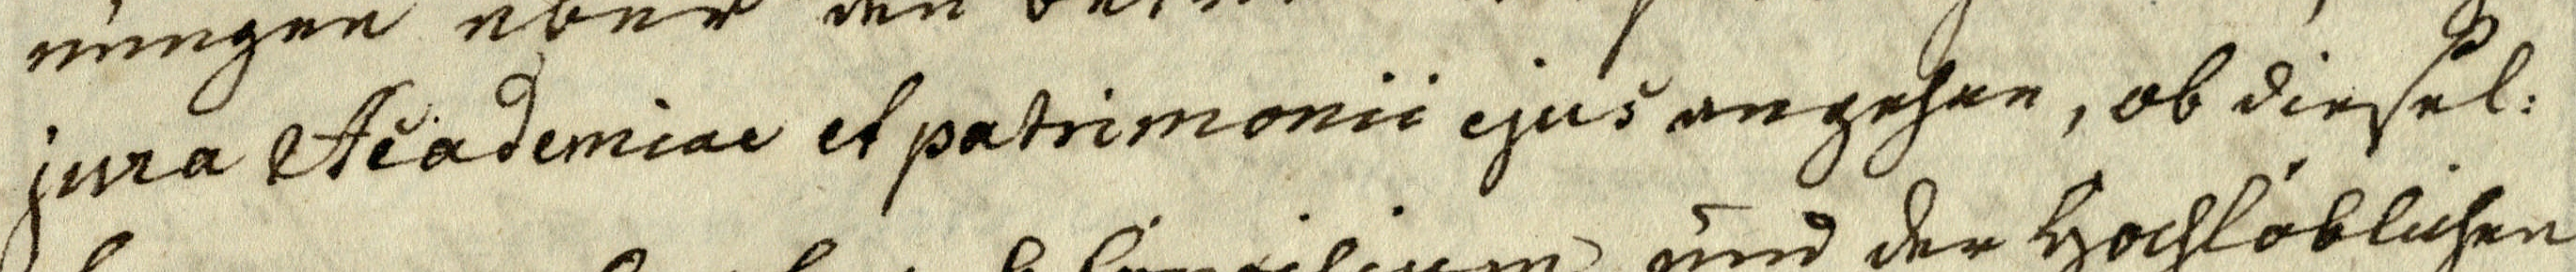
jua Academie et patrimonii ejus angehen, ob diesel¬
